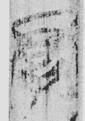君子
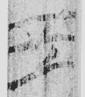玉
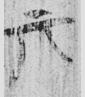亓（其）
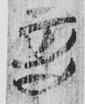言
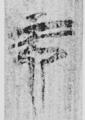而
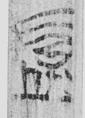○（展）
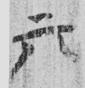亓（其）
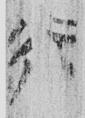行
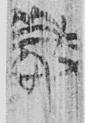敬
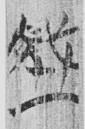城（成）
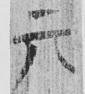亓（其）
